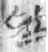爲
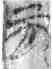而
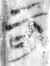可
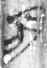明（名）
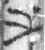之
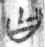曰
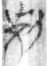死
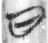日
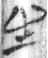生
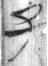子
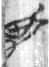男
